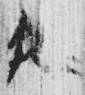於
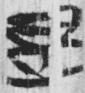是
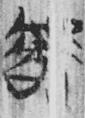唬（乎）
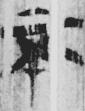不
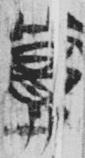賞
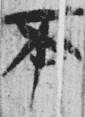不
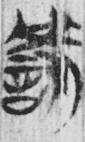罰
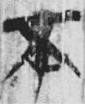不
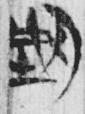型（刑）
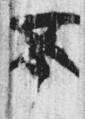不
